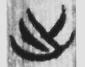出
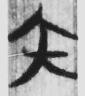內（入）
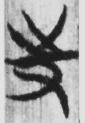寺（侍）
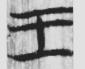王
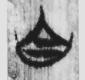自
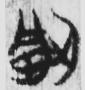○（荆）
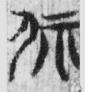𫵖
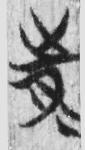之月
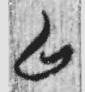㠯（以）
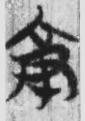○（就）
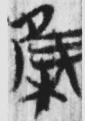集
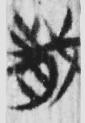歲（歲）
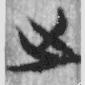之
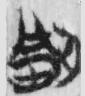○（荆）
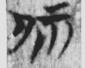𫵖
